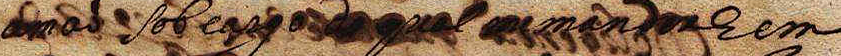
a maõ sob cargo do qual me mandou E em
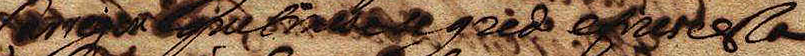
Carregou que tivese segredo e fizese esta
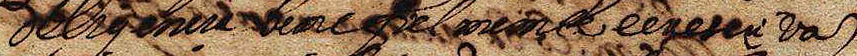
deligencia bem e fielmemte e eu escrivā
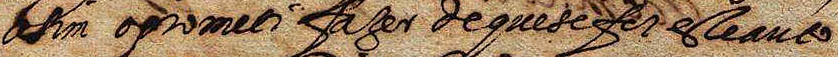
asim o prometi fazer de que se fez este auto
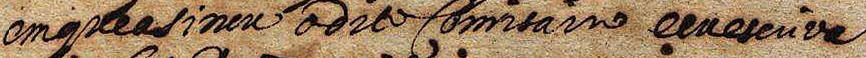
em que asinou o dito Comisairo e eu escrivā
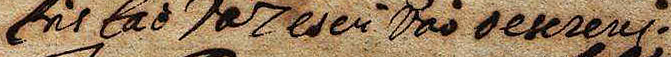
tristaõ Vaz escrivaõ o escreui.
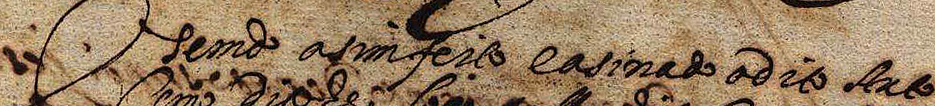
E semdo asim feito e asinado o dito Auto
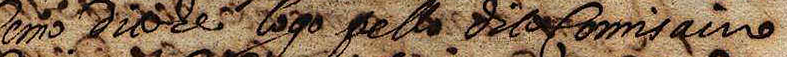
Como dito he logo pello dito Comisairo
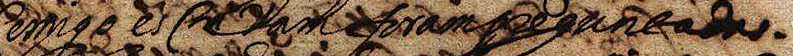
Comigo esCrivam foram preguntadas.
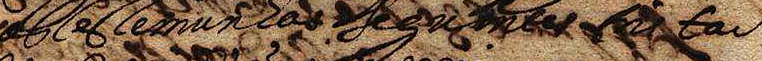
as testemunhas seguintes tristaõ
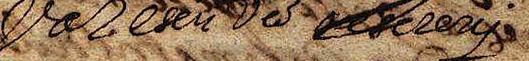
Vaz escrivaõ o escreuj
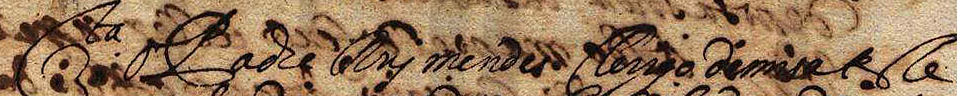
Tta. O Padre Ruj mendes Clerigo de misa teste
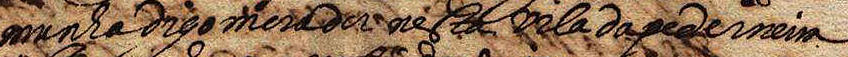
munha digo morador nesta vila da pederneira
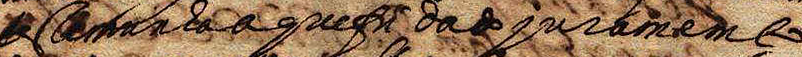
testemunha a que foi dado juramemto
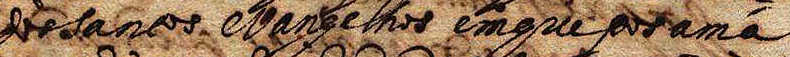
dos santos evangelhos em que pos a mā
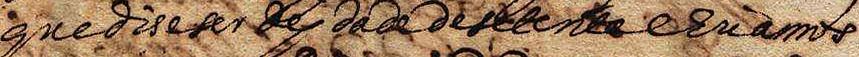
que dise ser de jdade de setenta e hū annos,
